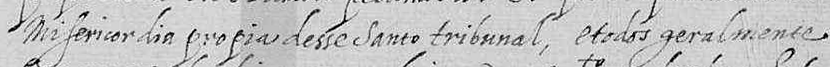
misericordia propia desse Santo tribunal, e todos geralmente
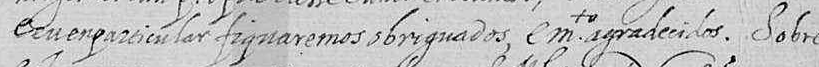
e eu en particular fiquaremos obriguados, e m.to agradecidos. Sobre
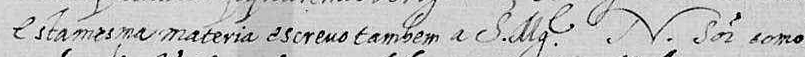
esta mesma materia escreuo tambem a S. Mg.e N. Sor̄ como
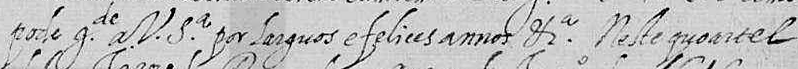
pode g.de a V. S.a por larguos e felices annos &a. Neste quartel
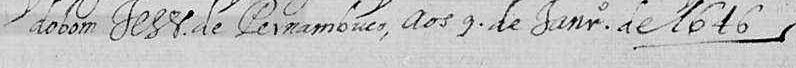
do bom Jesv de Pernambuco, aos 9. de Janr.o de 1646
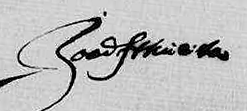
Joaõ frs uieira
